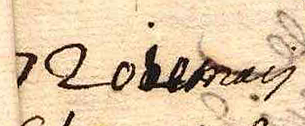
7201 e mais
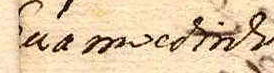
hūa moedinha
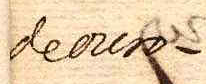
de ouro
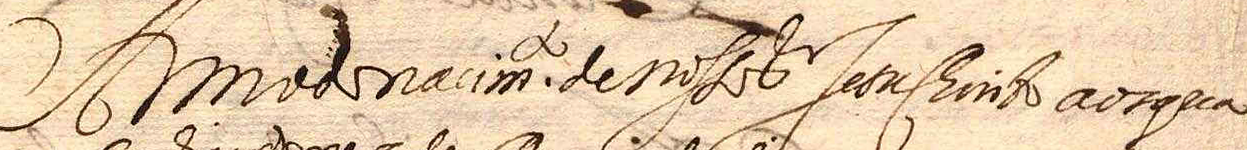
Anno do nacim.to de nosso sor Jesu Christo aos qua
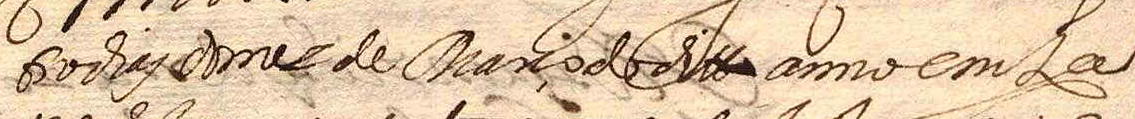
tro dias do mez de Março do ditto anno em Lxa
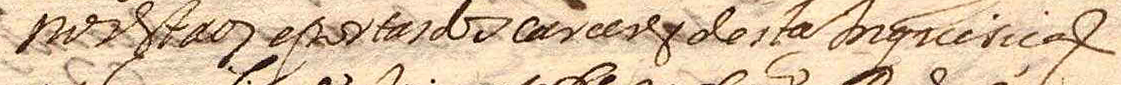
nos estaos e portas dos carceres desta Inquisiçaõ
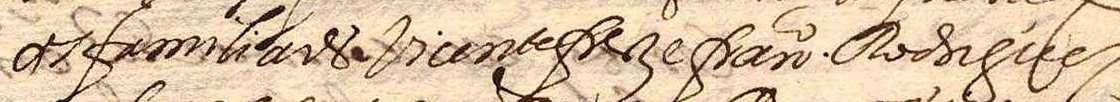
os familiares Vicente frz e fran.co Rodriguez
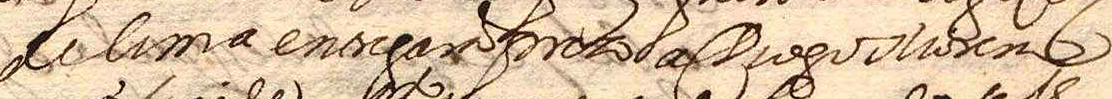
de lima entregaraõ prezo a Diogo Moreno
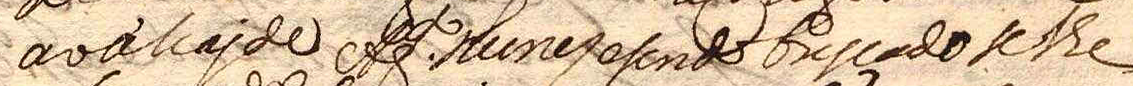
ao alcajde Ag.to Nunes e sendo buscado se lhe
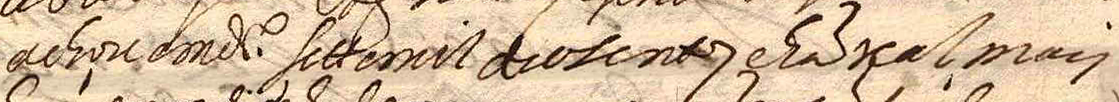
achou em dr.o sette mil duzentos e hū real mais
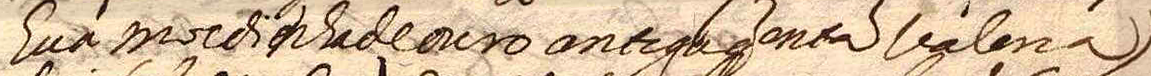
huā moedinha de ouro antiga q̄ entaõ valeria
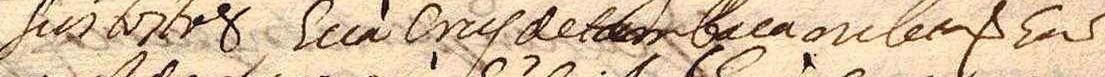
seis tostoes huā crus de tambaca ou letaõ hū
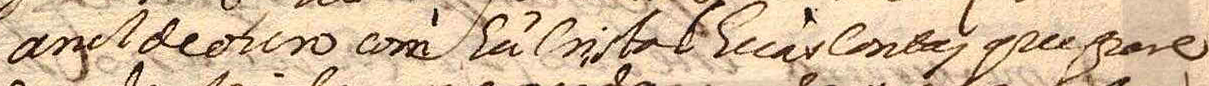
anel de ouro com hū cristal huās contas que pare
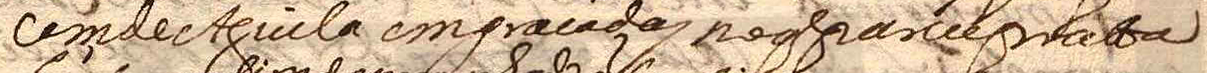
cem de Aguila emgraçadas no q̄ parece pratta
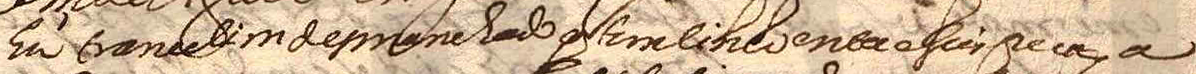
hū trancelim desmanchado q̄ tem cincoenta e seis peças a
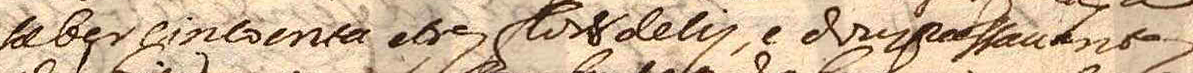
saber cincoenta e tres flores de liz, e dous passauantes
